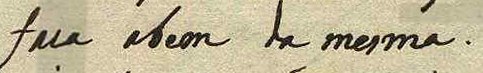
faça a bem da mesma.
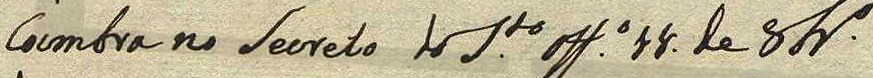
Coimbra no Secreto do S.to off.o 18 de otb.o
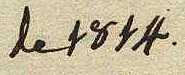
de 1814.
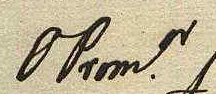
O Promt.or
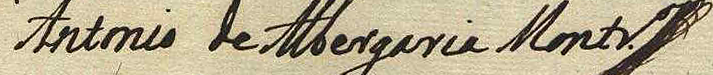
Antonio de Albergaria Montr.o
